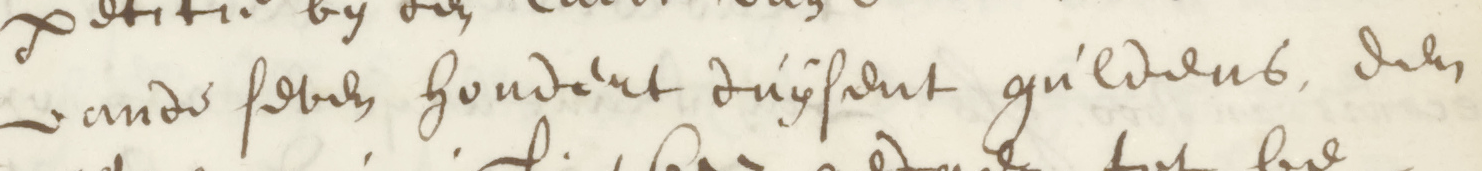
vande seven hondert duijsent guldens, den
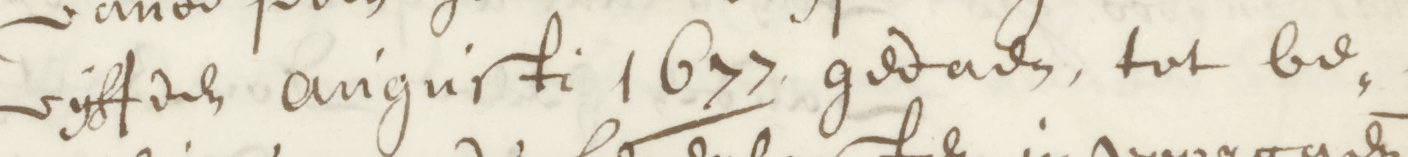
vijffden augusti 1677 gedaen, tot be„
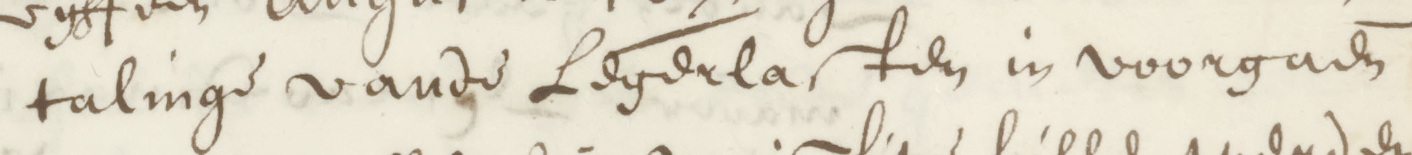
talinge vande Legerlasten in voorgaen
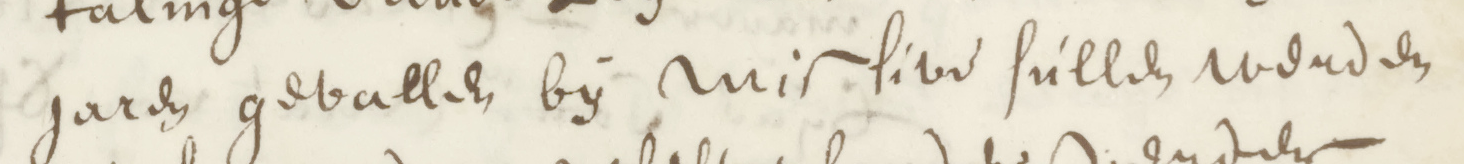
jaren gevallen bij missive sullen werden
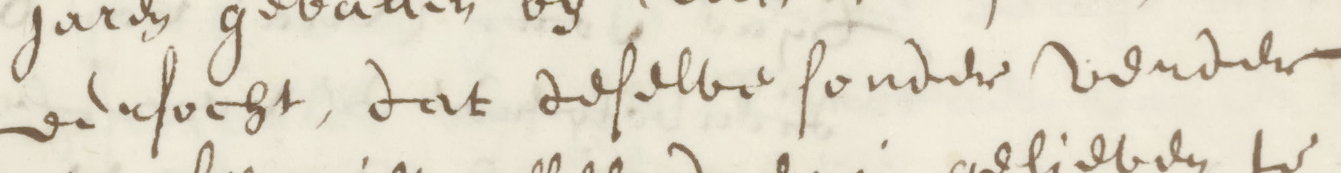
versocht, dat deselve sonder verder
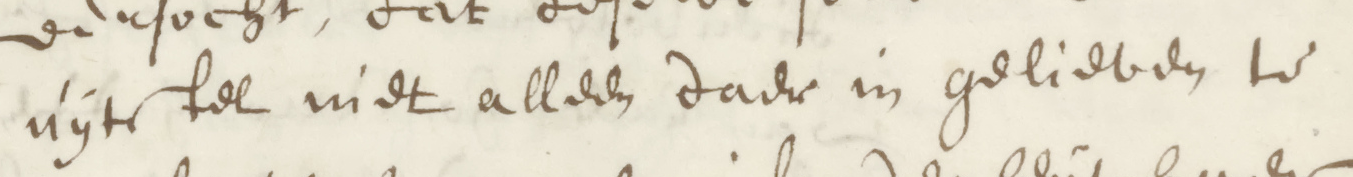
uijtstel niet alleen daer in gelieven te
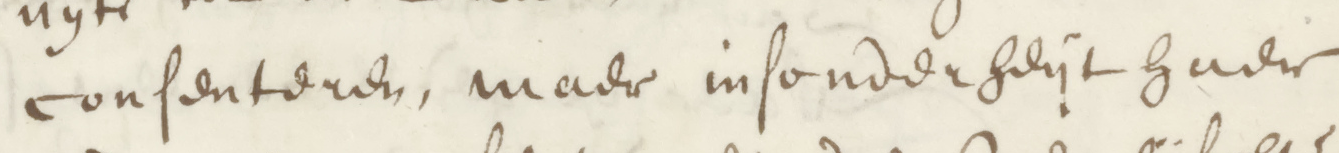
consenteren, maer insonderheijt haer
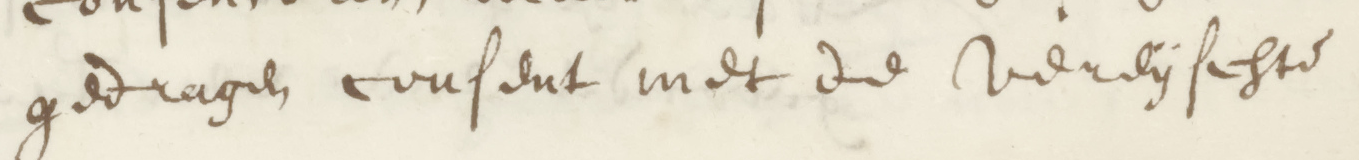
gedragen consent met de vereijschte
